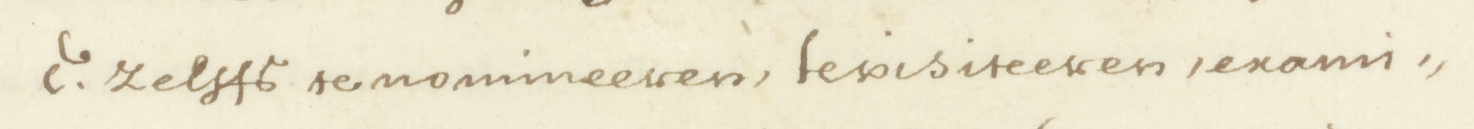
E. zelffs te nomineeren te visiteeren, examin„
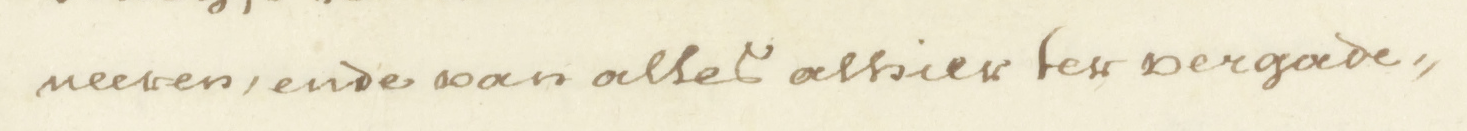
neeren ende van alles alhier ter vergade„
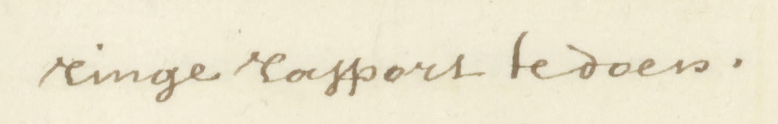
ringe rapport te doen.
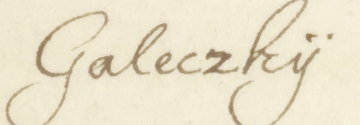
Galeczkij
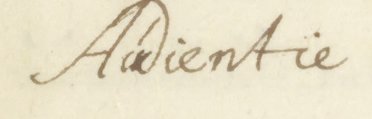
Audientie
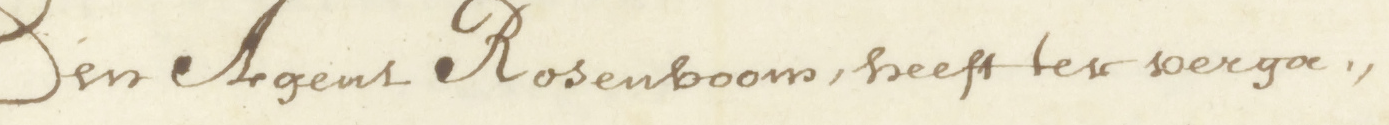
Den Agent Rosenboom heeft ter verga„
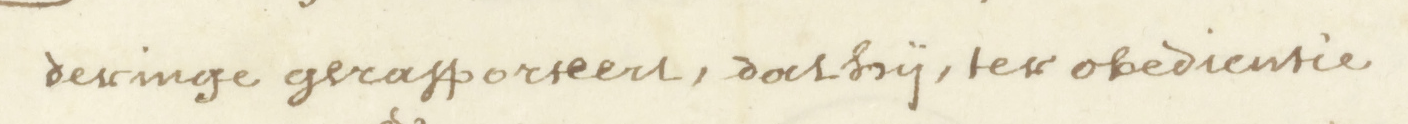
deringe gerapporteert, dat hij ter obedientie
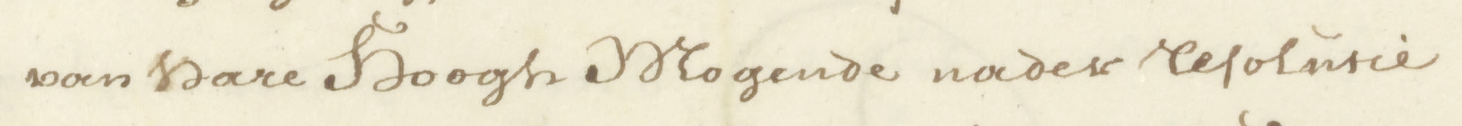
van Hare Hoogh Mogende nader resolutie
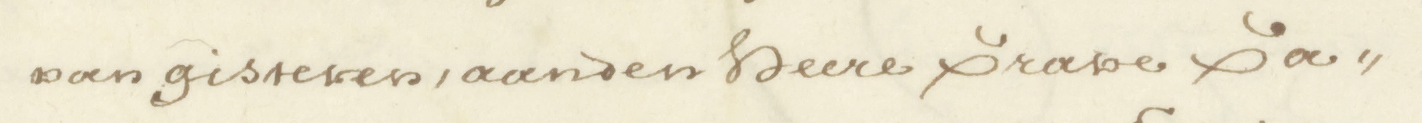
van gisteren, aanden Heere Grave Ga„
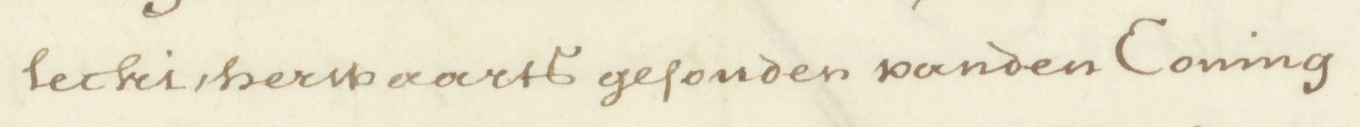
lecki herwaarts gesonden vanden Coning
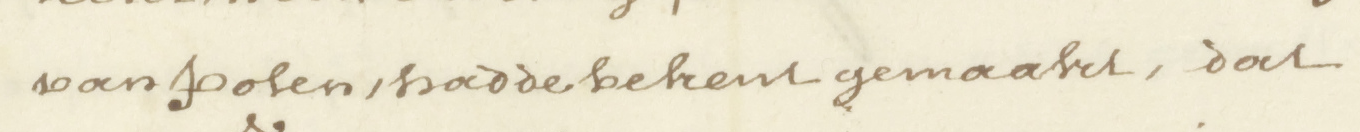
van Polen, hadde bekent gemaakt, dat
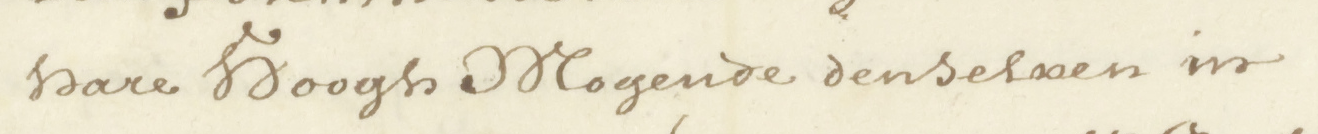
hare Hoogh Mogende denselven in
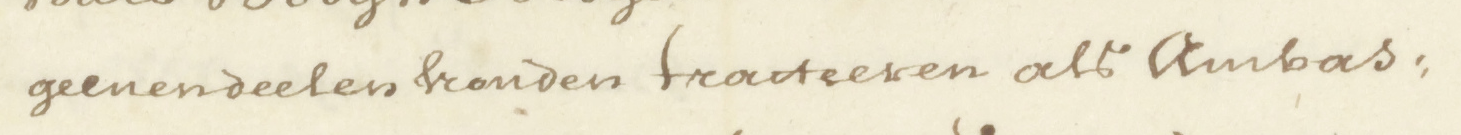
geenendeelen konden tracteeren als Ambas„
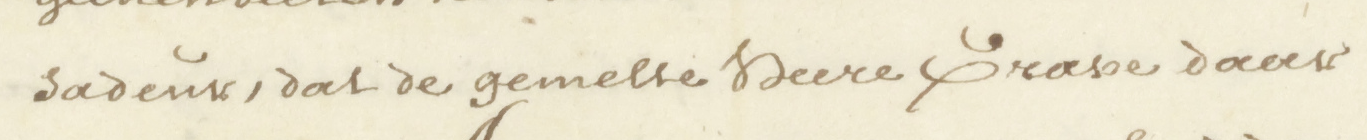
sadeur, dat de gemelte Heere Grave daar
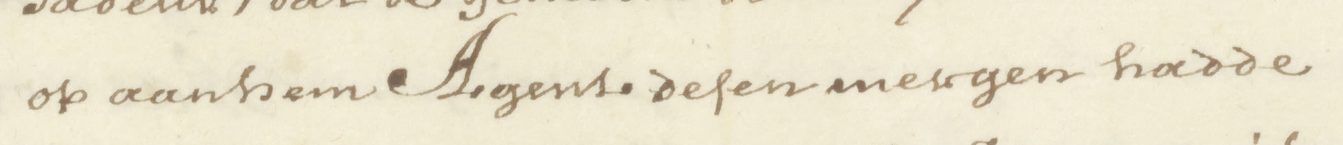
op aan hem Agent desen mergen hadde
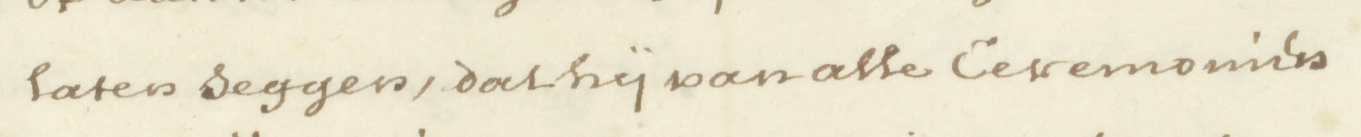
laten seggen, dat hij van alle Ceremonien
